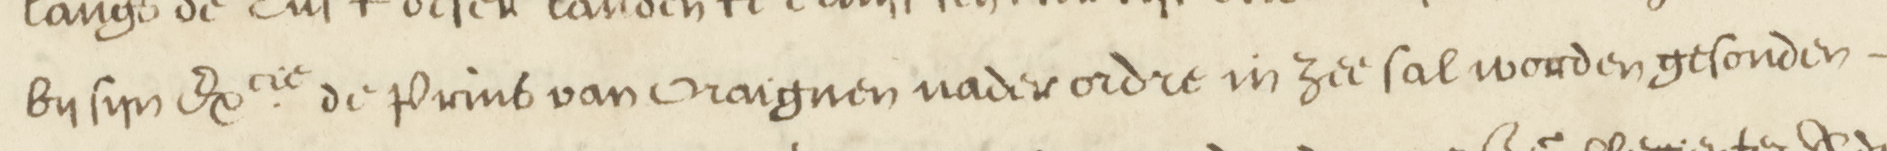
by syn Excie. de Prins van Oraignen nader ordre in zee sal worden gesonden
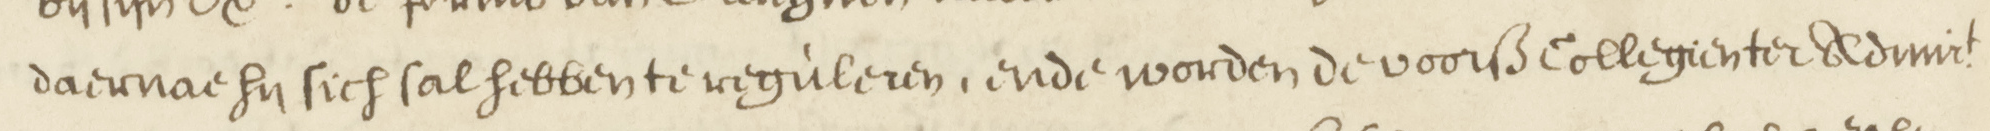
daernae hy sich sal hebben te reguleren, ende worden de voors Collegien ter Admirt
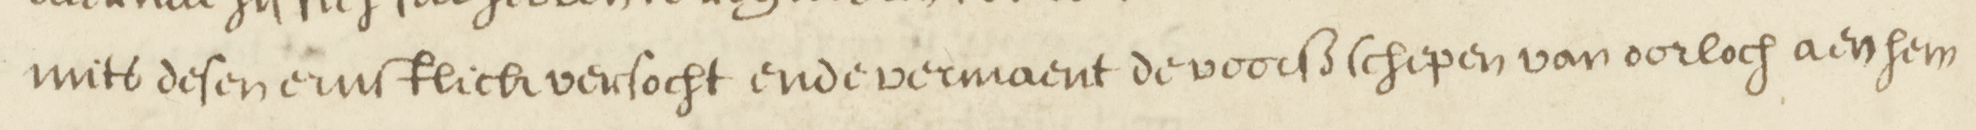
mits desen ernstlick versocht ende vermaent de voors schepen van oorloch aen hem
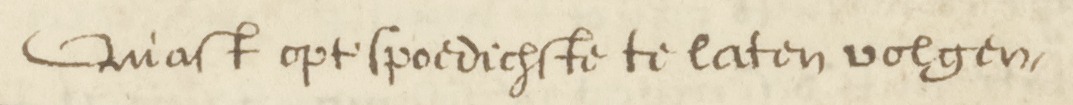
Quast opt' spoedichste te laten volgen.
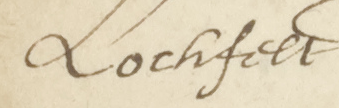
Lochfelt
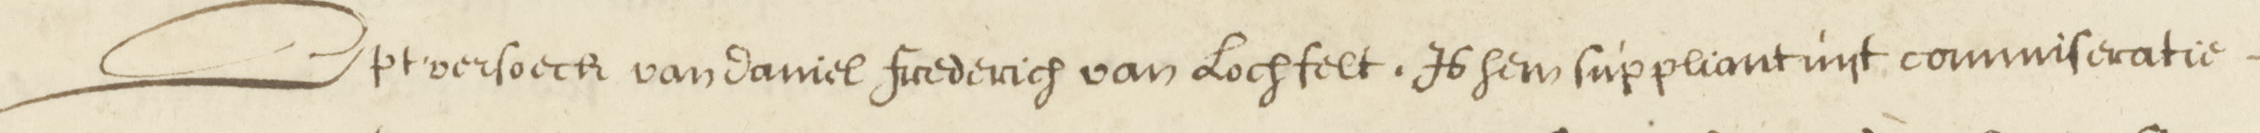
Opt versoeck van Daniel frederich van Lochfelt. Is hem suppliant uyt commiseratie
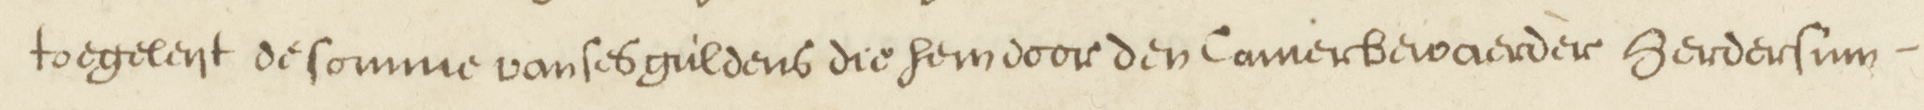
toegeleyt de somme van ses guldens die hem door den Camerbewaerder Herdersum
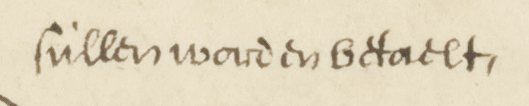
sullen worden betaelt,
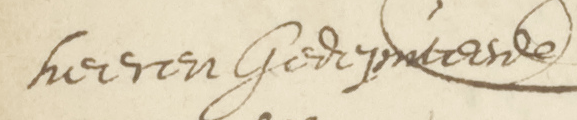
heeren Gedeputeerde
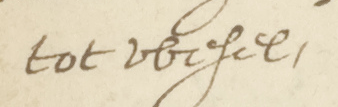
tot wesel.
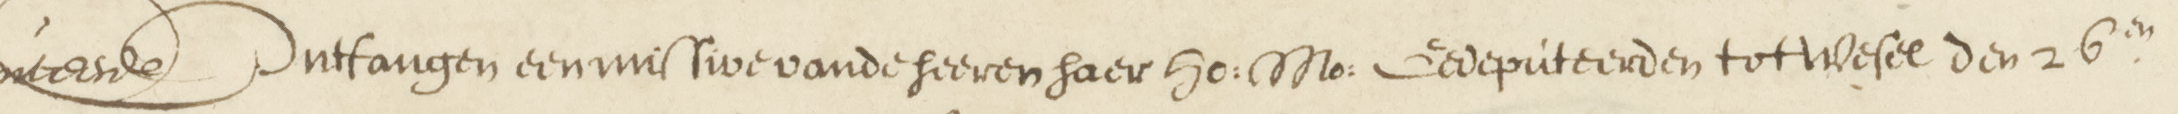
Ontfangen een missive vande heeren haer Ho:Mo: Gedeputeerden tot Wesel den 26en.
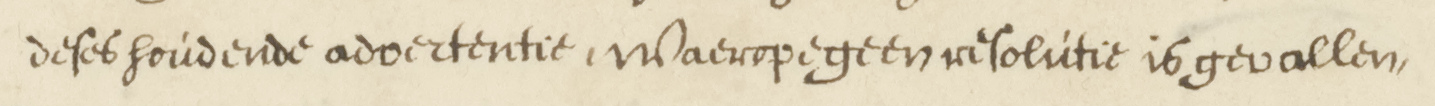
deses houdende advertentie. Waerop egeen resolutie is gevallen.
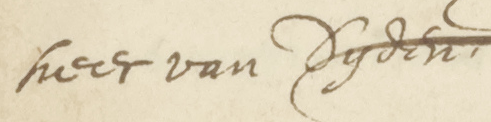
heer van Dyden
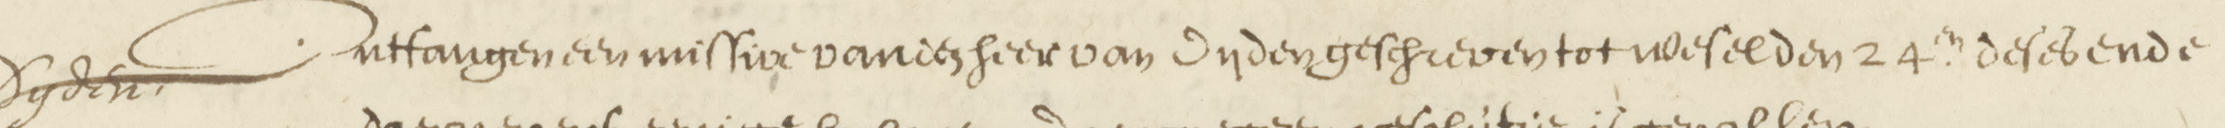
Ontfangen een missive vanden heer van Dyden geschreven tot Wesel den 24en deses ende
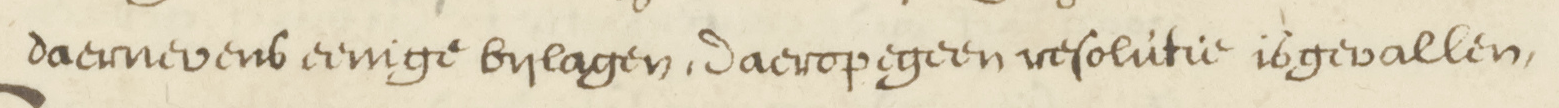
daernevens eenige bylagen, daerop egeen resolutie is gevallen.
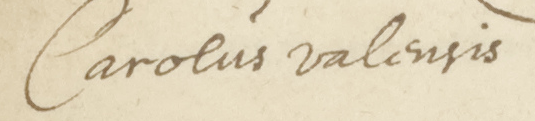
Carolus valensis
